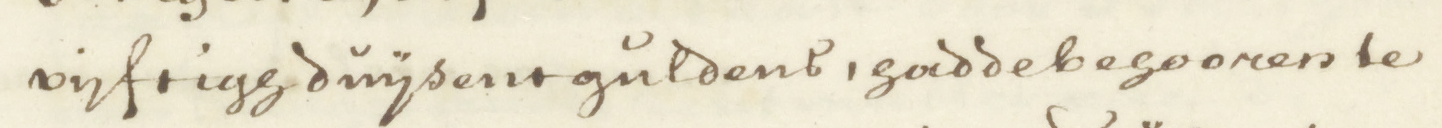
vijftighduijsent guldens, hadde behooren te
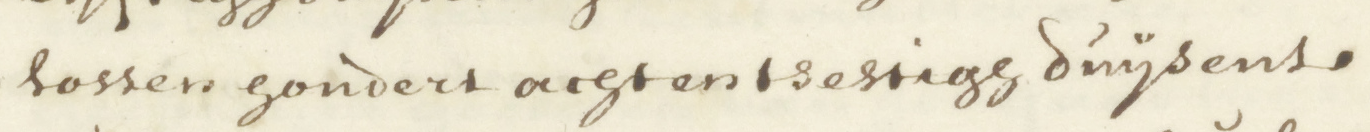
lossen hondert achten sestigh duijsent
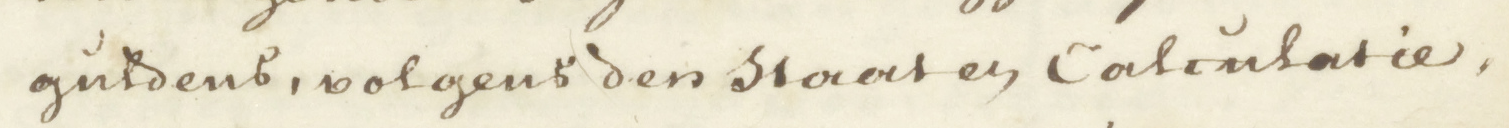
guldens, volgens den Staat en Calculatie,
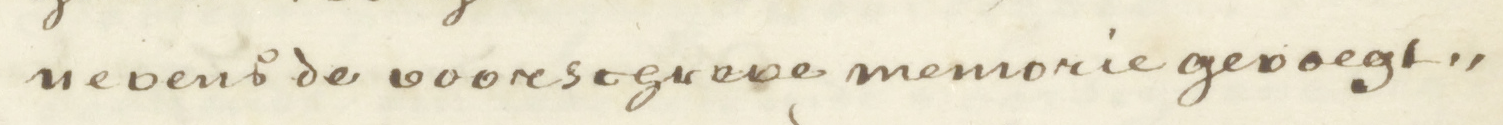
nevens de voorschreve memorie gevoegt„
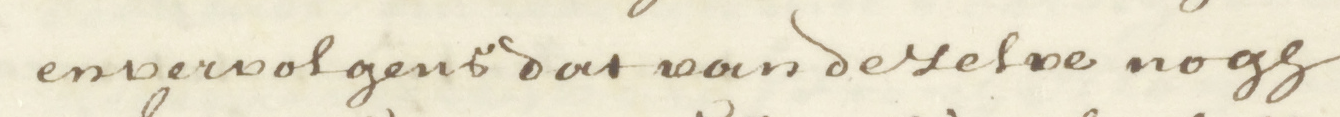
en vervolgens dat van dezelve nogh
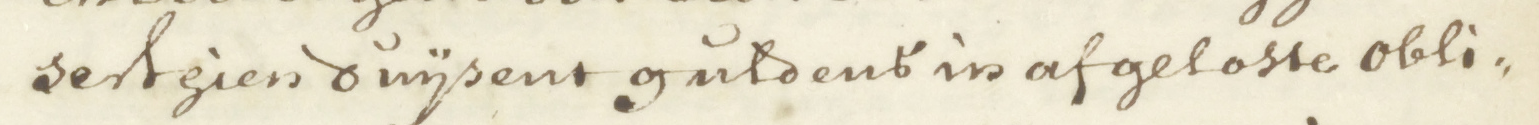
sesthien duijsent guldens in afgeloste obli„
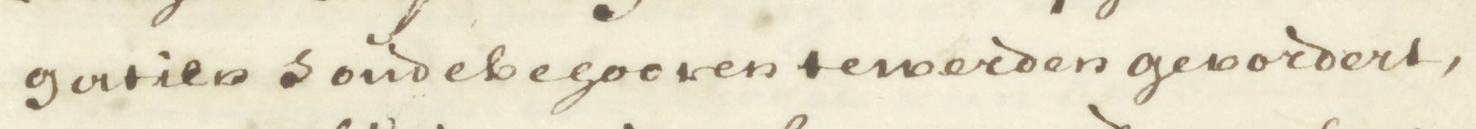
gatien soude behooren te werden gevordert,
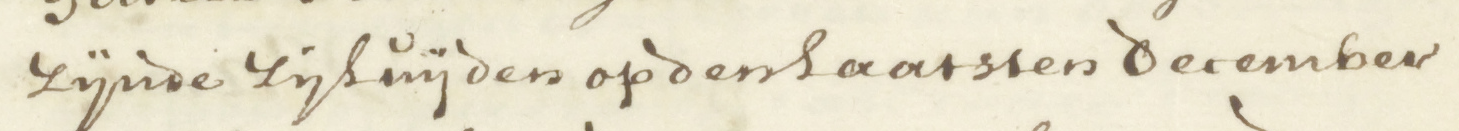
zijnde zijluijden op den laatsten December
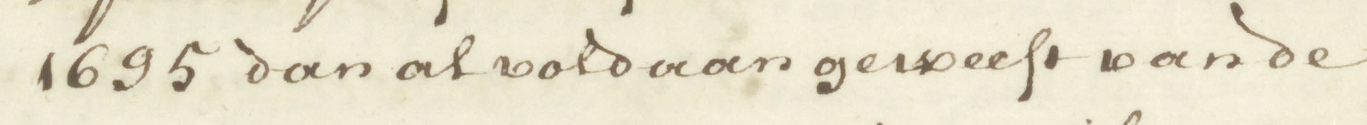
1695 dan alvoldaan geweest van de
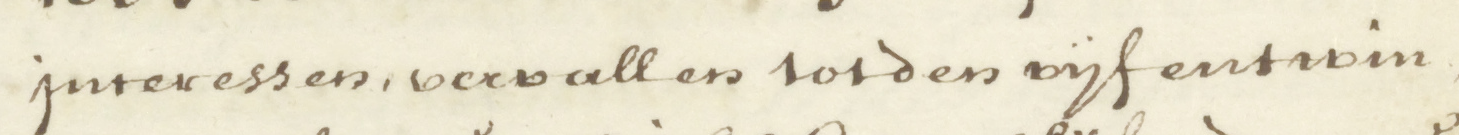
interessen, vervallen tot den vijfentwin
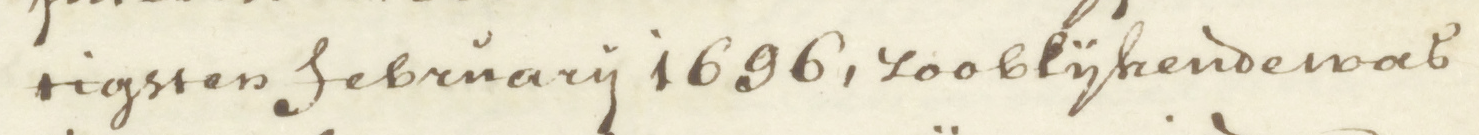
tigsten februarij 1696, zoo blijkende was
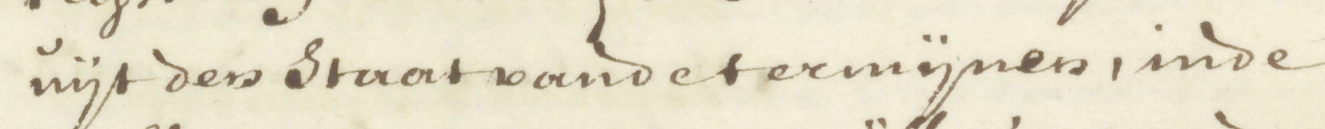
uijt den Staat vande termijnen, inde
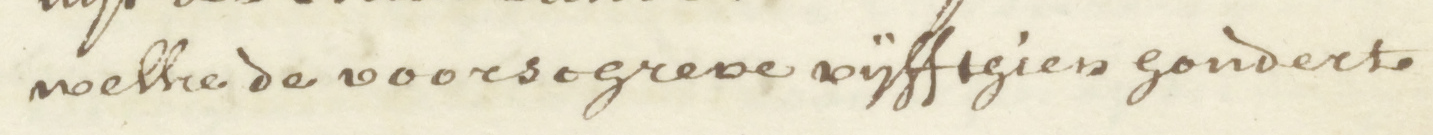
welke de voorschreve vijffthien hondert
